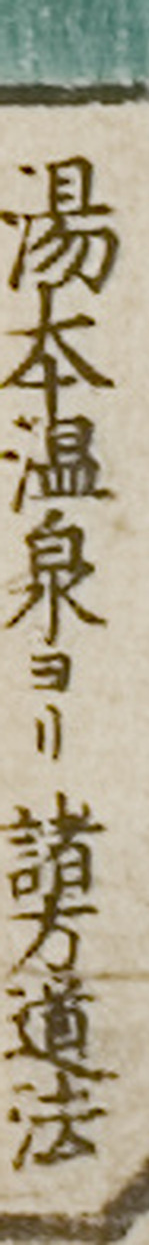湯本温泉ヨリ諸方道法
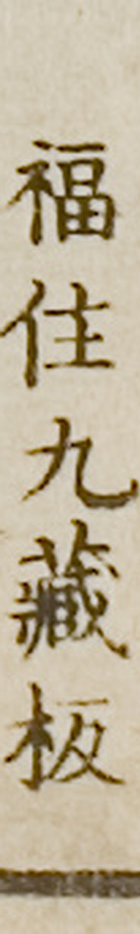福住九蔵板
